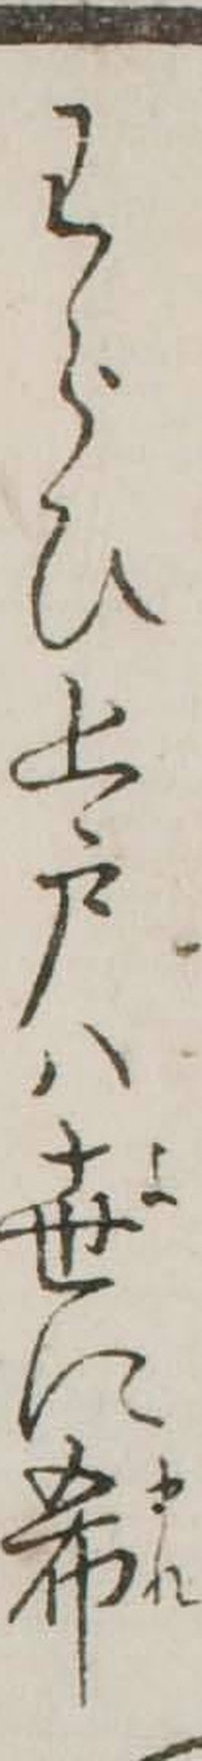わらひ上戸は世に希
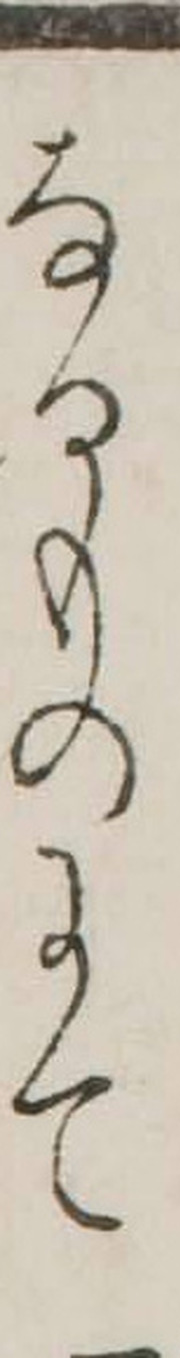なるものにて予
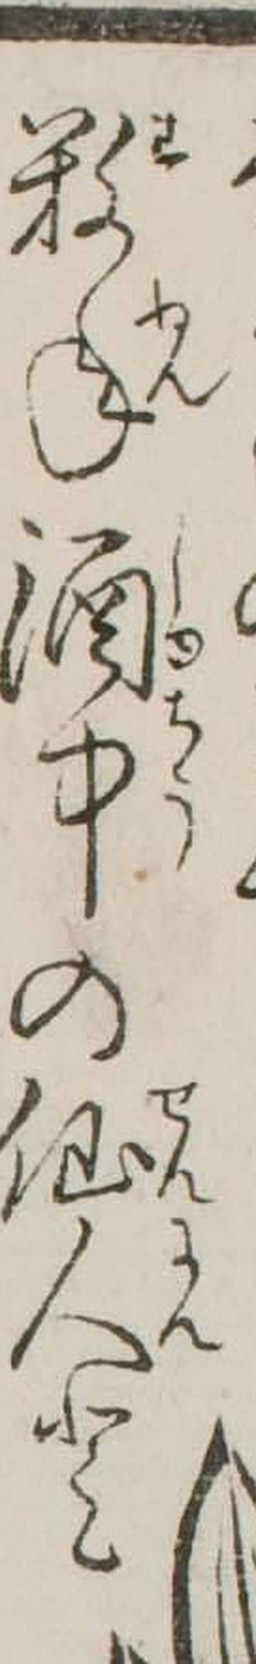数年酒中の仙人と
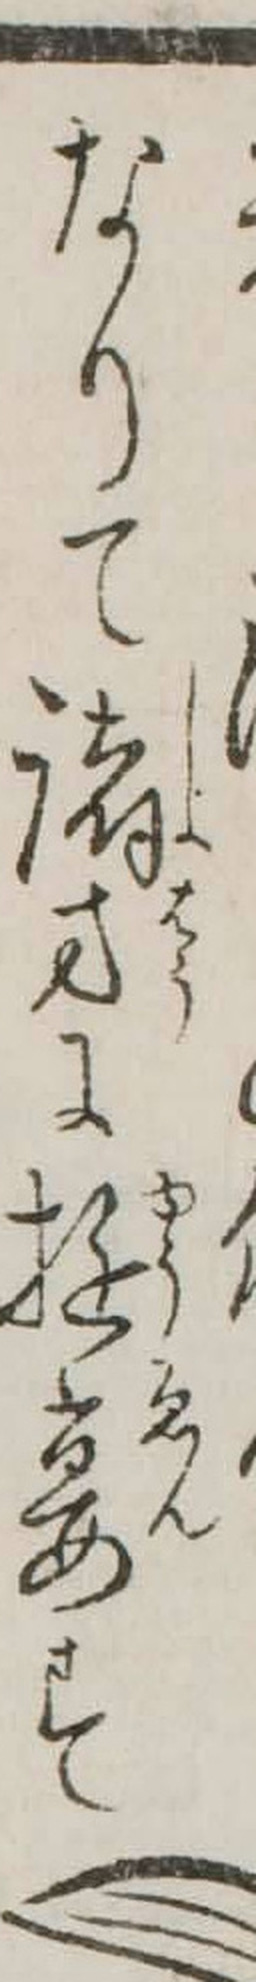なりて諸方に遊宴す
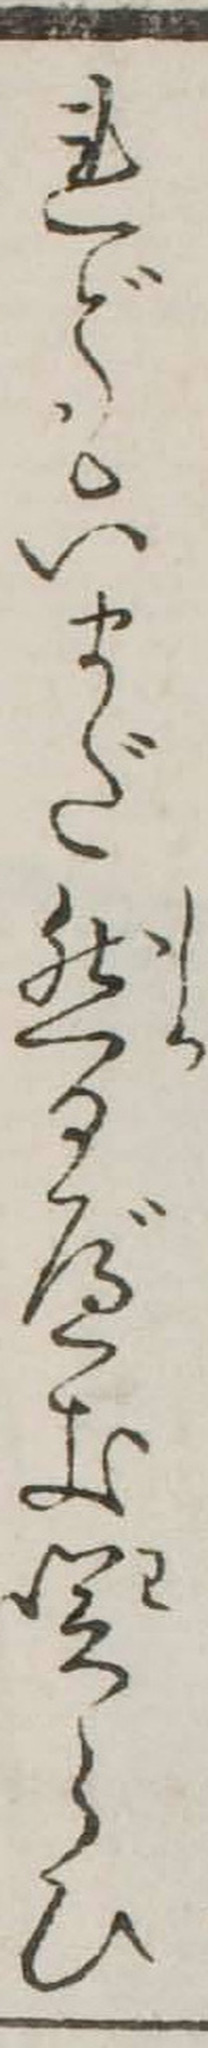れどもいまだ然るべき笑らひ
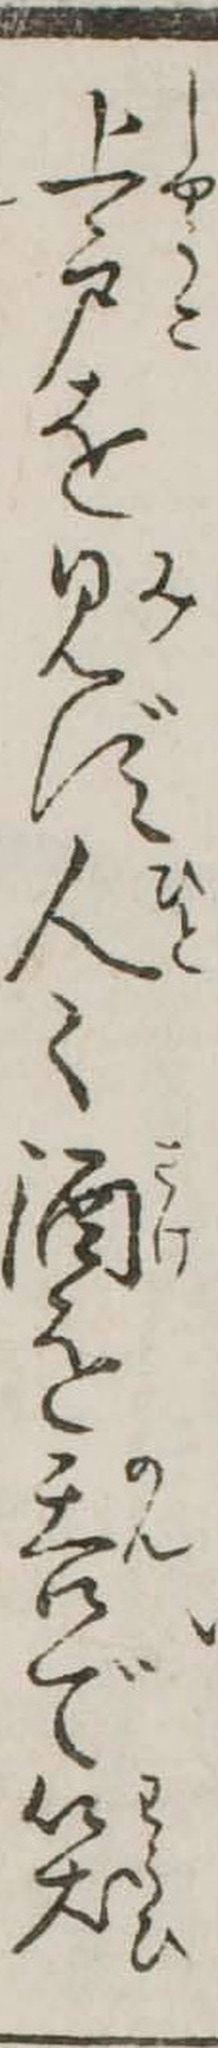上戸を見ず人々酒を呑で笑
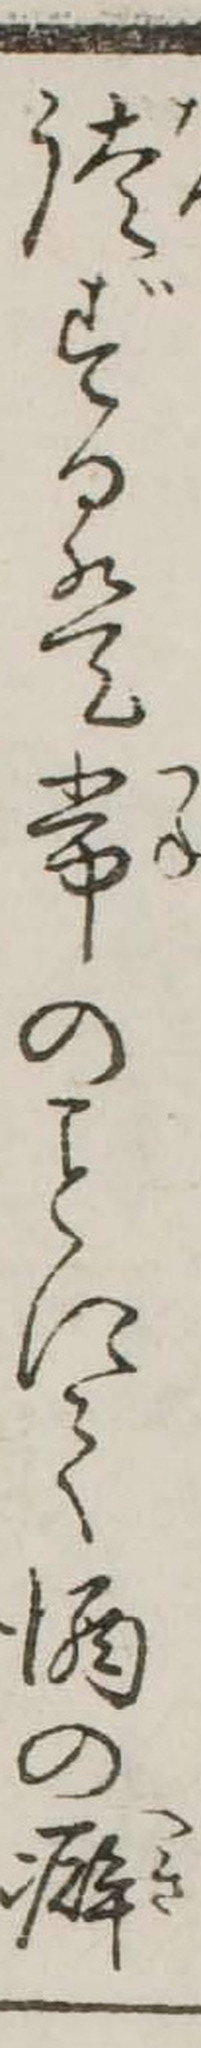談ずる是常のことにて酒の癖
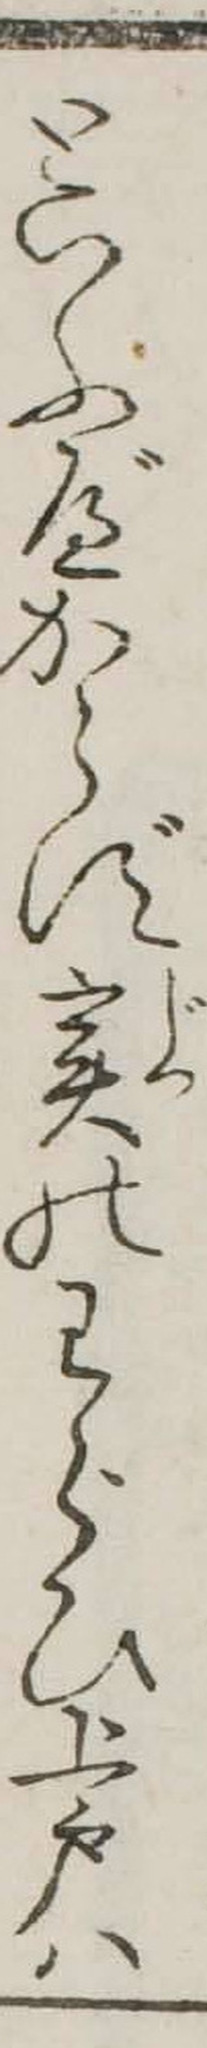といふべからず実のわらひ上戸は
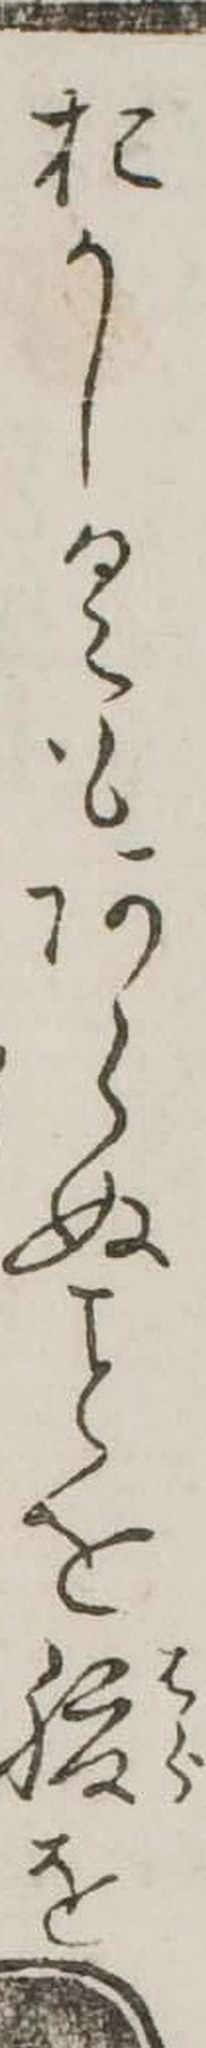おかしくもあらぬことを腹を
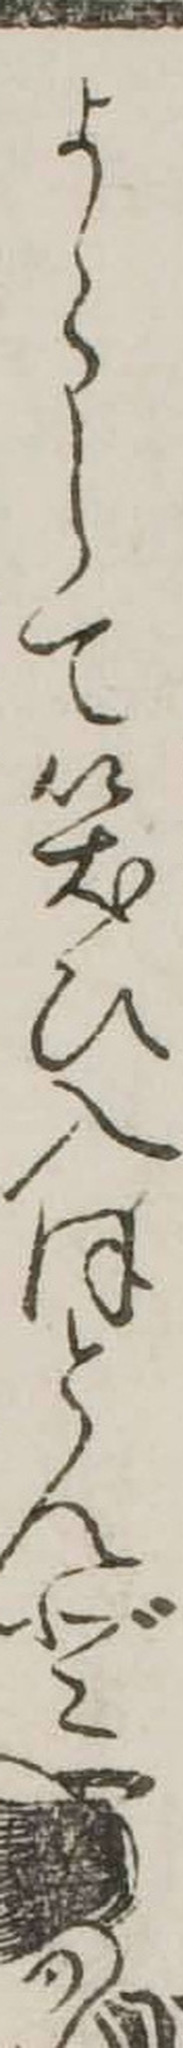よらして笑ひ入ほとんど
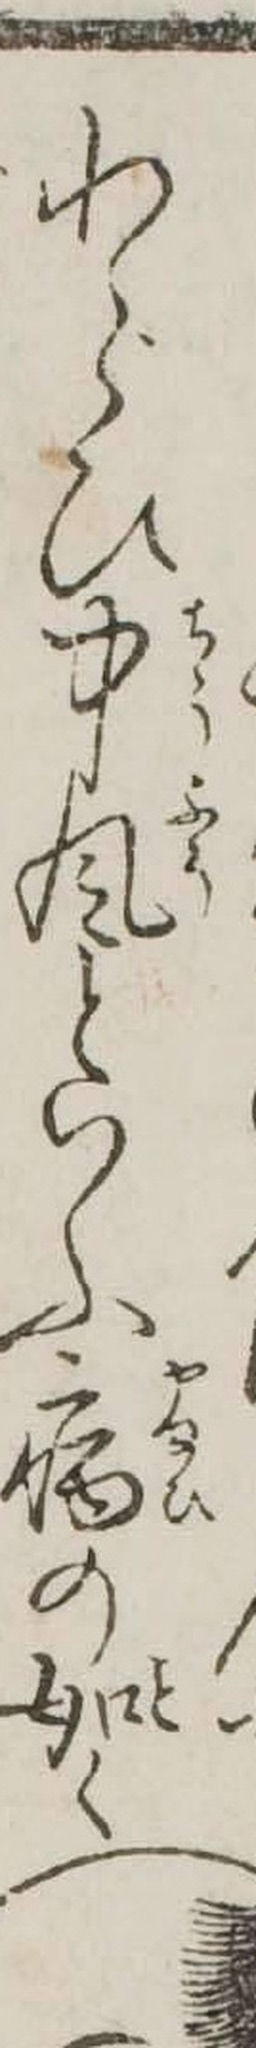わらひ中風といふ病の如く
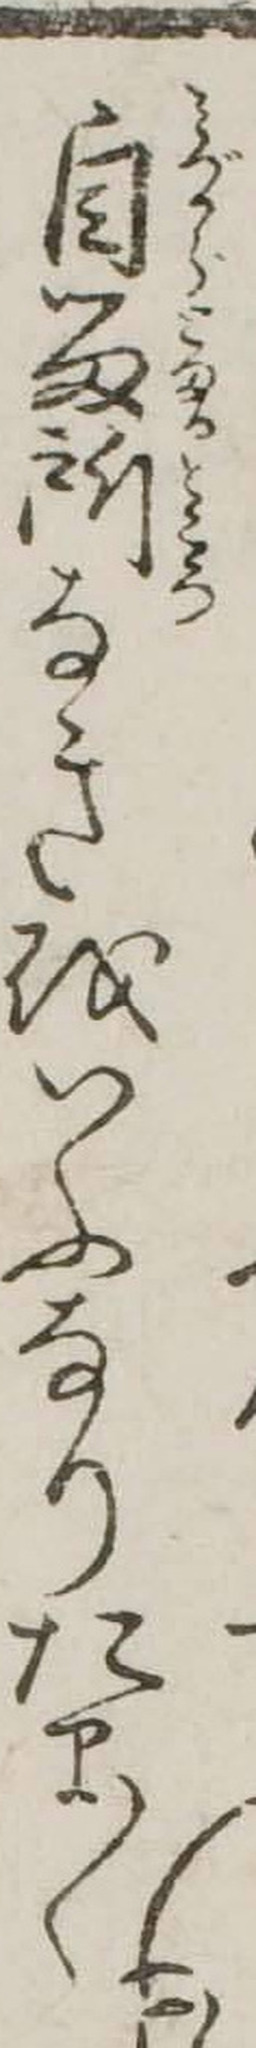自留所なきをいふなりたま〳〵
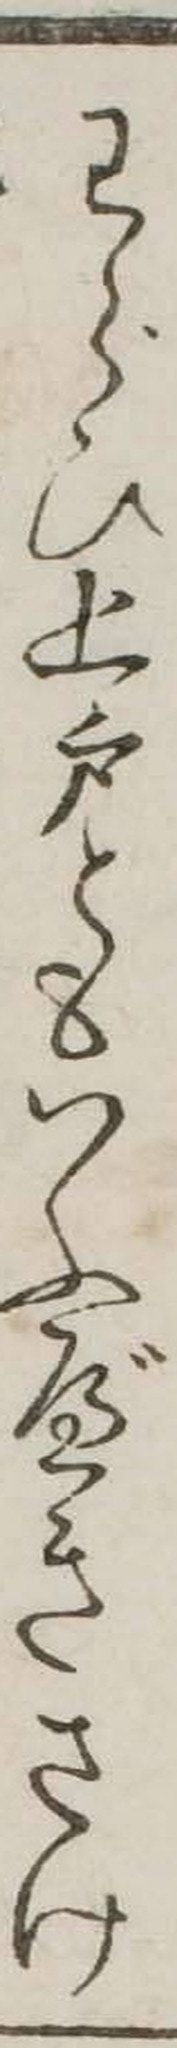わらひ上戸ともいふべきさけ
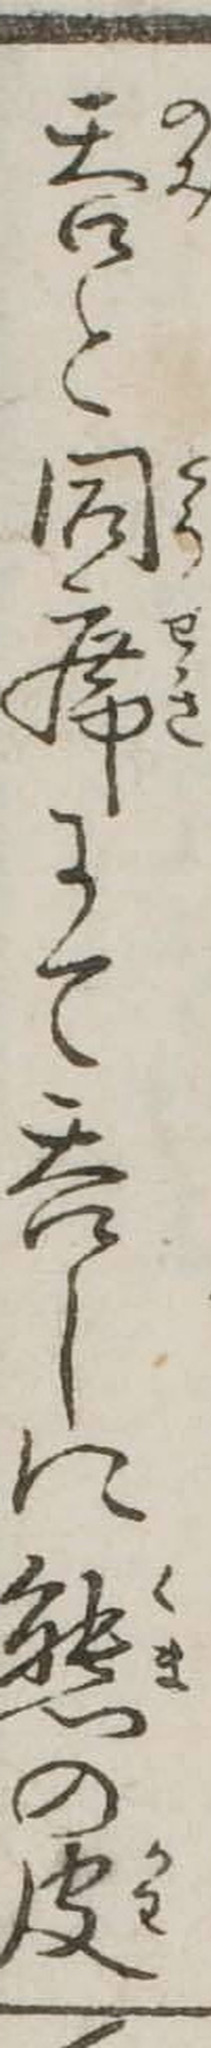呑と同席にて呑しに熊の皮
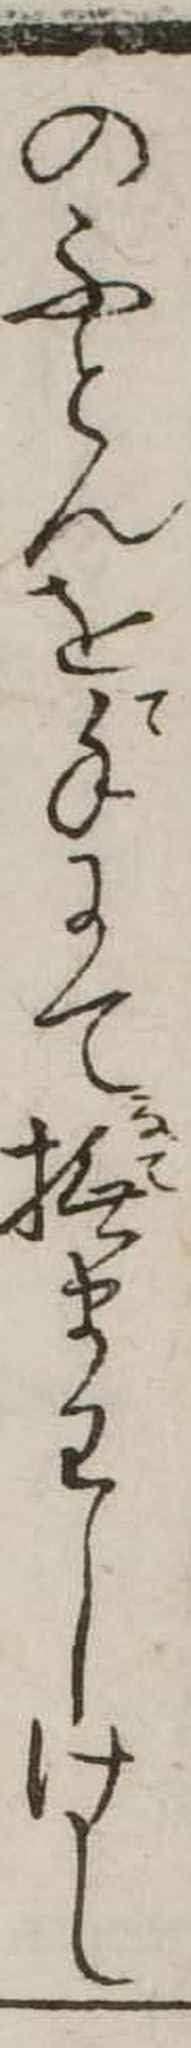のふとんを手にて撫まわしけし
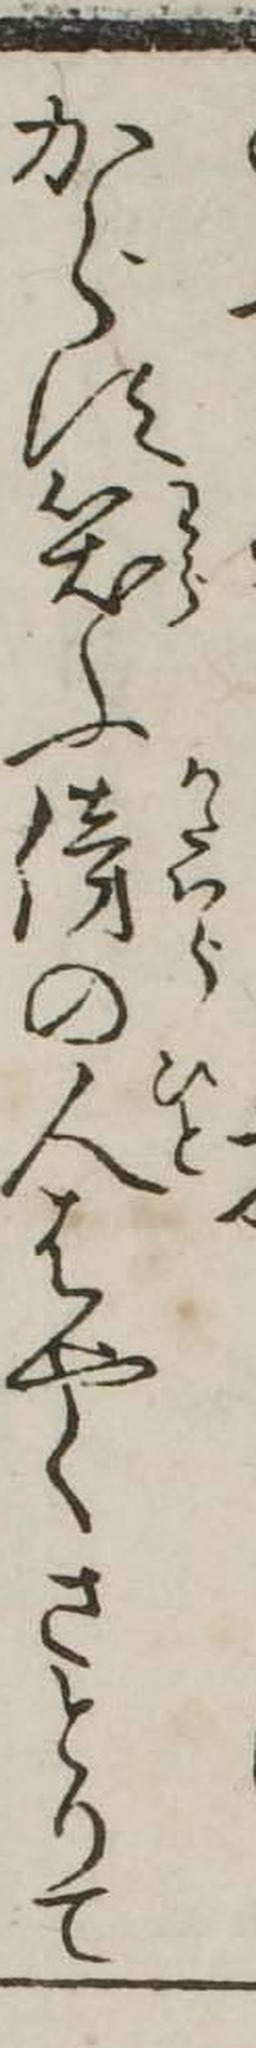からす笑ふ傍の人はやくさとりて
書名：繪本不盡泉
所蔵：国文学研究資料館
